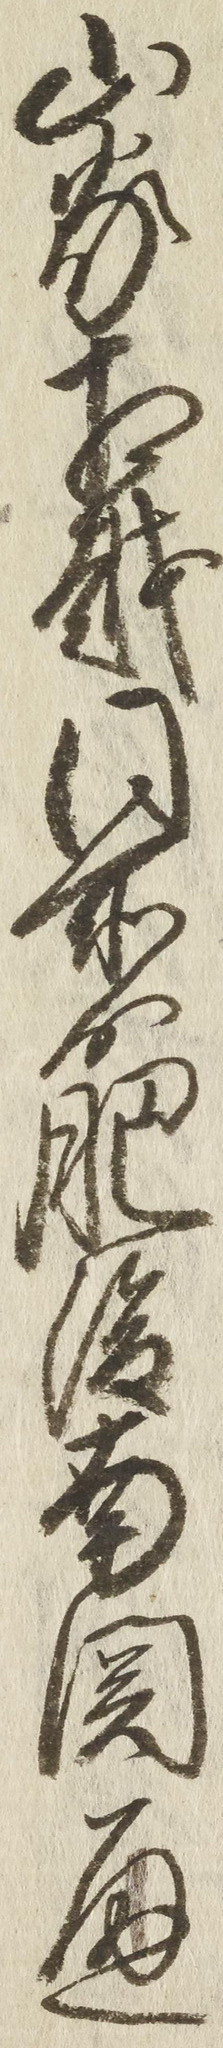山家相越同所ゟ肥後南関通
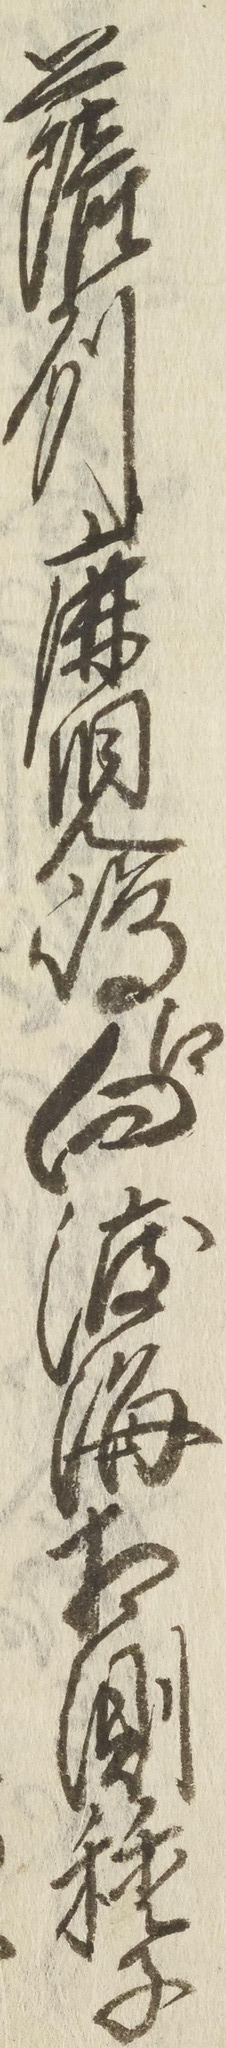薩州鹿児嶋江向渡海相測種子
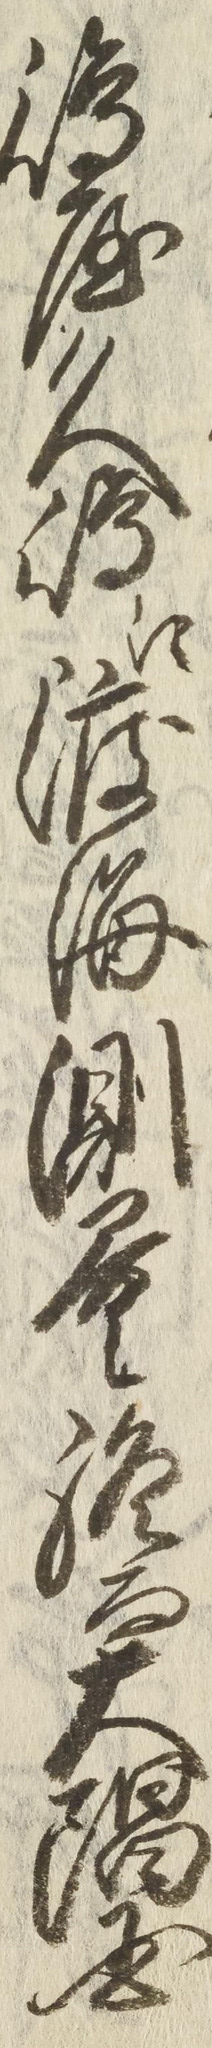嶋屋久嶋江渡海測量終而大隅国
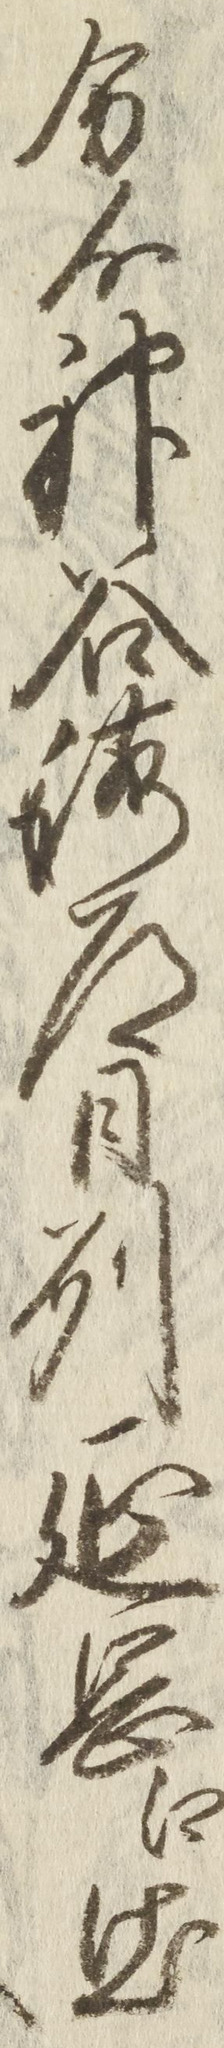分ゟ神谷海道日州延岡江出
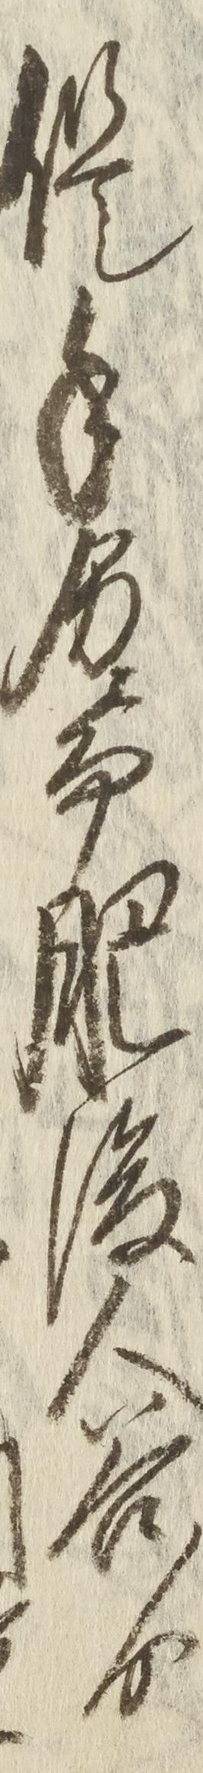但シ手分ニ而肥後人谷ゟ
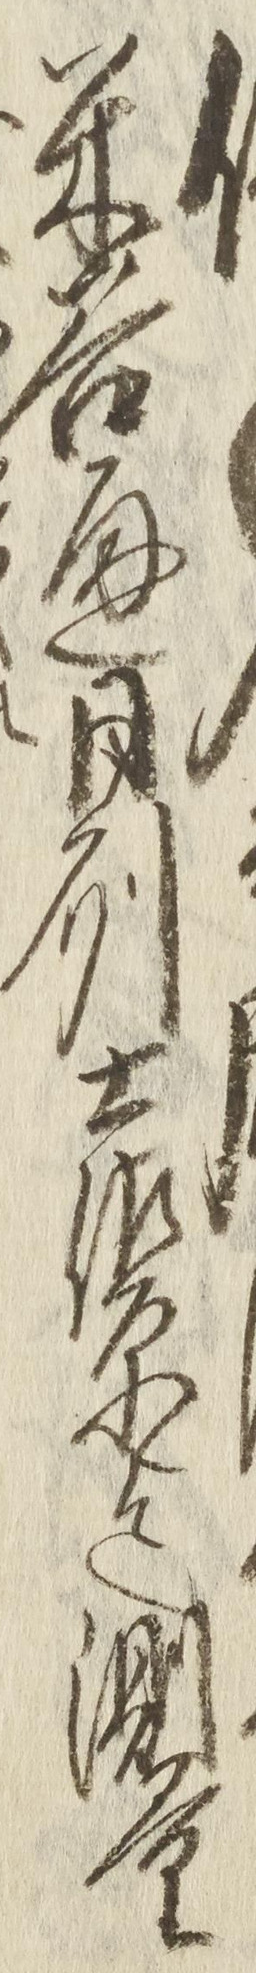米谷通日州土佐原迄測量
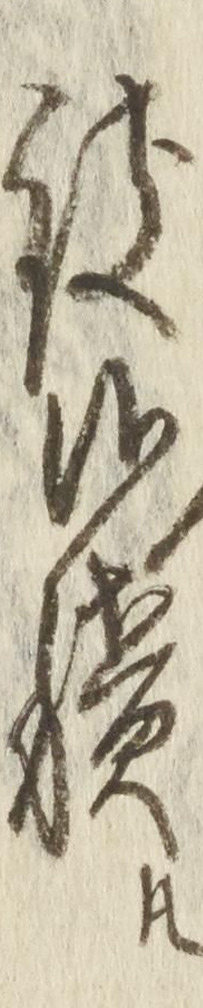致候積ル
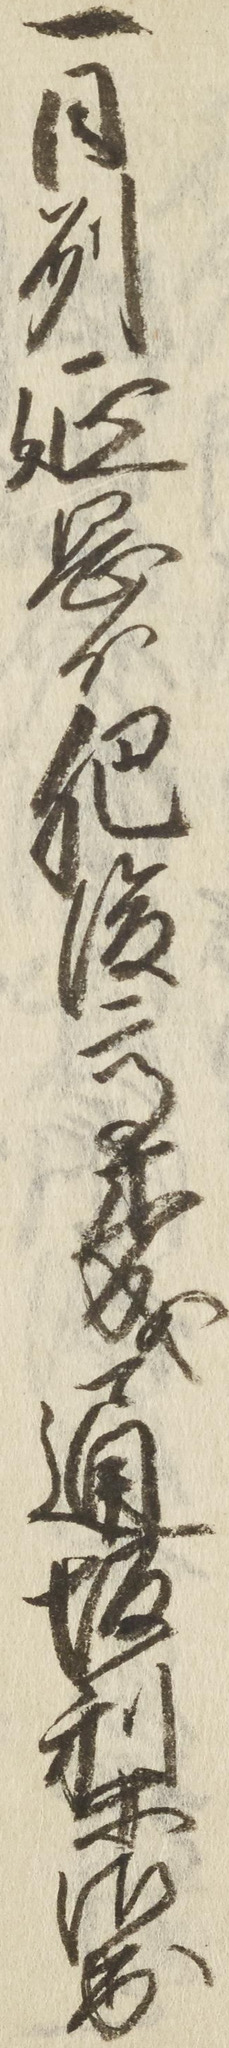一日州延岡ゟ肥後高森通坂梨御出
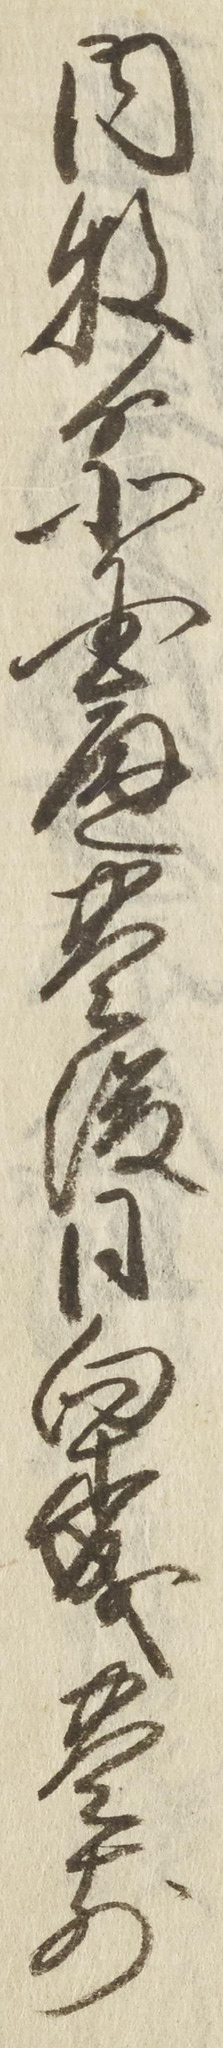内牧ゟ北国通豊後日向森豊前

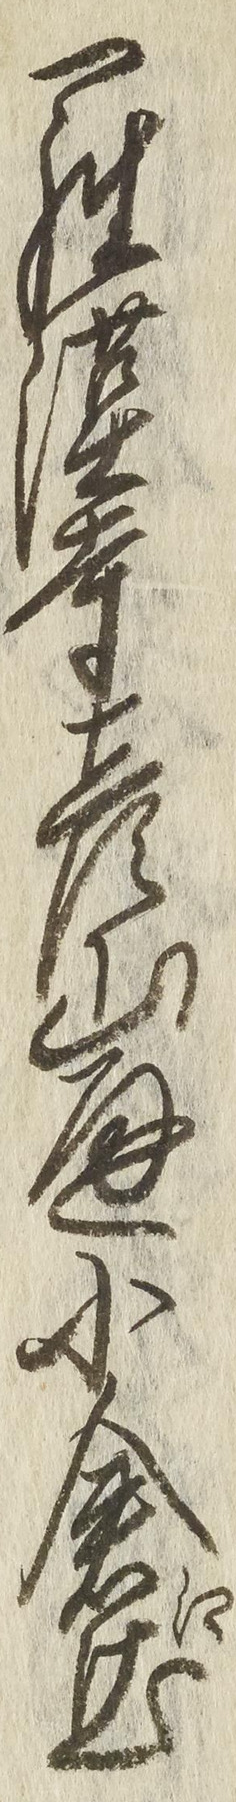羅漢寺彦山通小倉江出
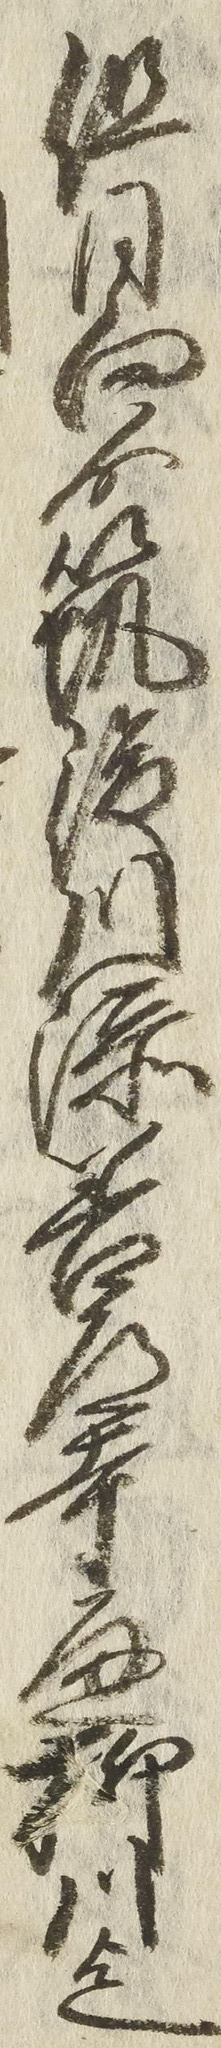但日向ゟ筑後川添善道寺通柳川迄
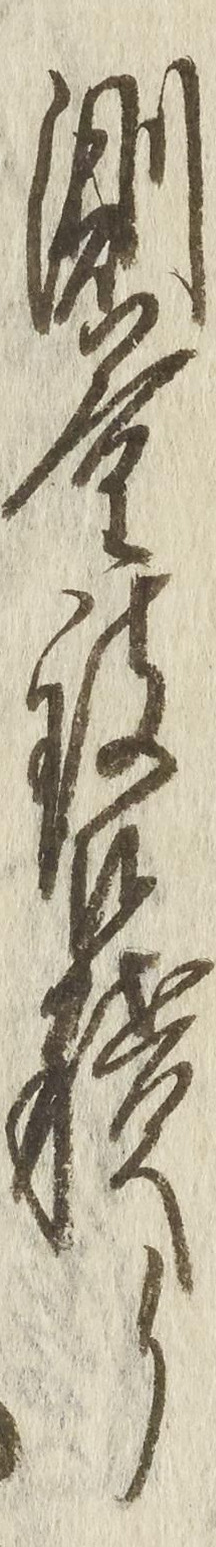測量致候積り
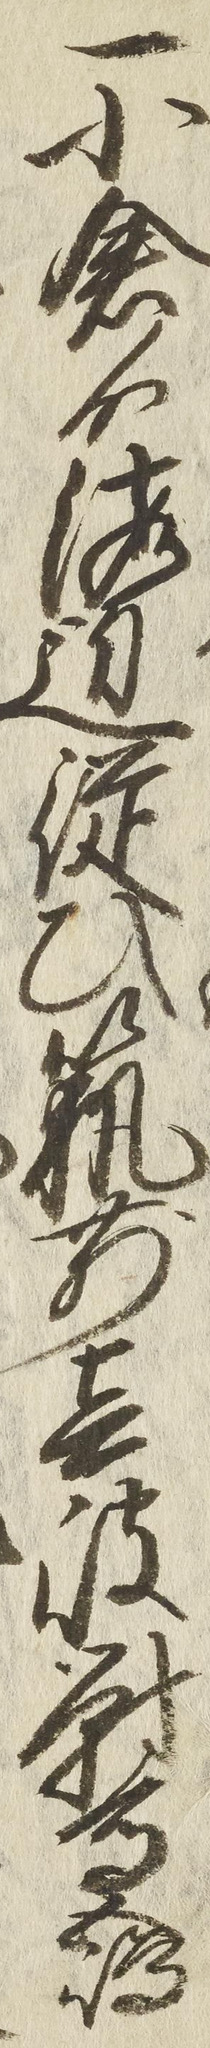一小倉ゟ海辺従ひ筑前壱岐対馬五嶋
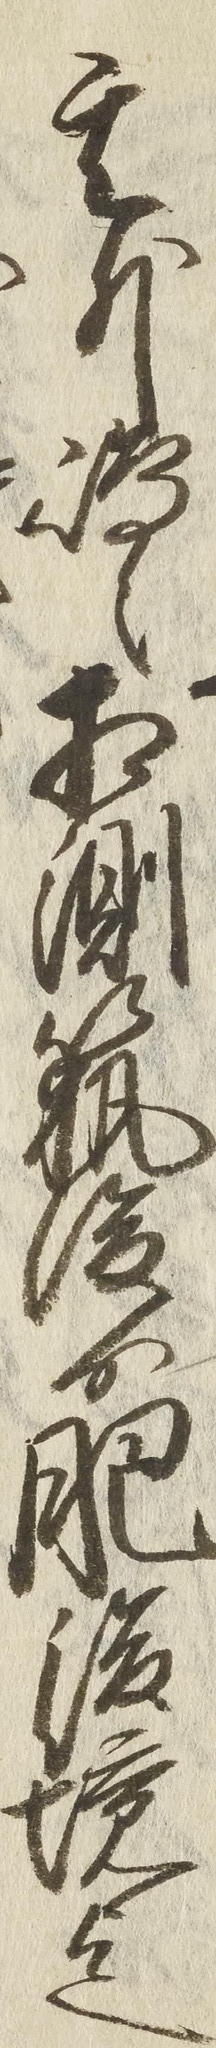其外嶋々相測筑後ゟ肥後境迄
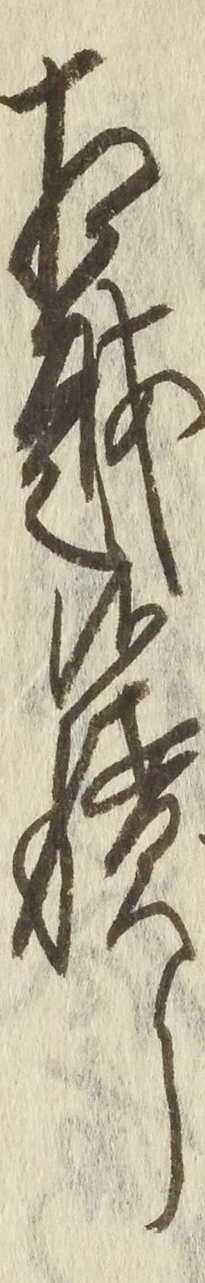相越候積り
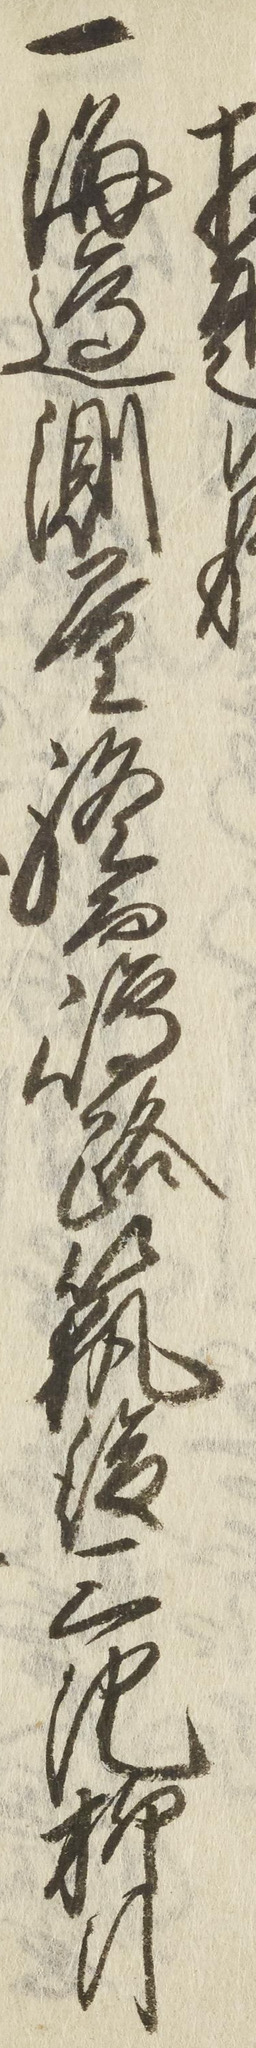一海辺測量終而嶋路筑後三池柳川
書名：天文方御廻御先触写
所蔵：東京大学地震研究所図書室 Earthquake Research Institute Library, The University of Tokyo, JAPAN
